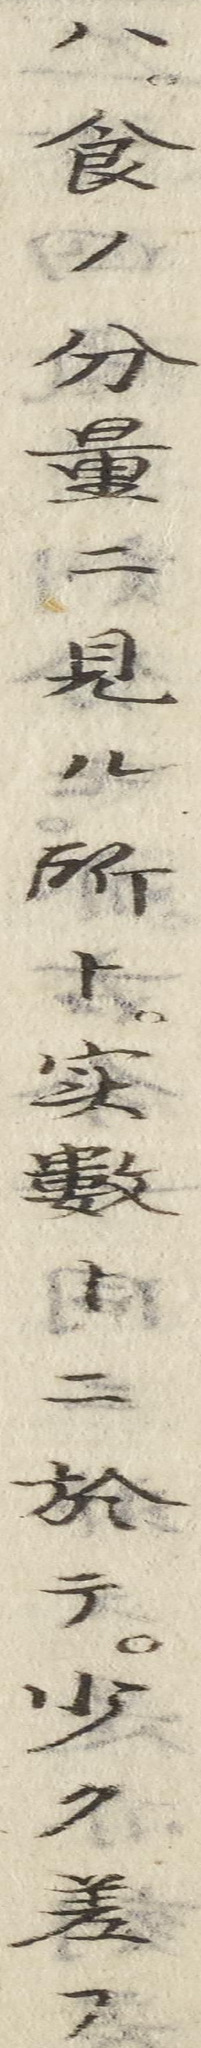ハ食ノ分量ニ見ル所ト。実数トニ於テ。少ク差フ
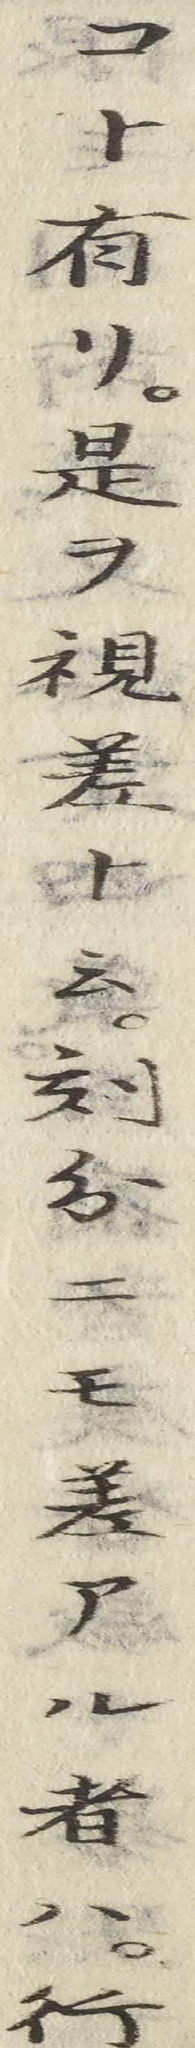コト有リ。是ヲ視差ト云。刻分ニモ差アル者ハ。行
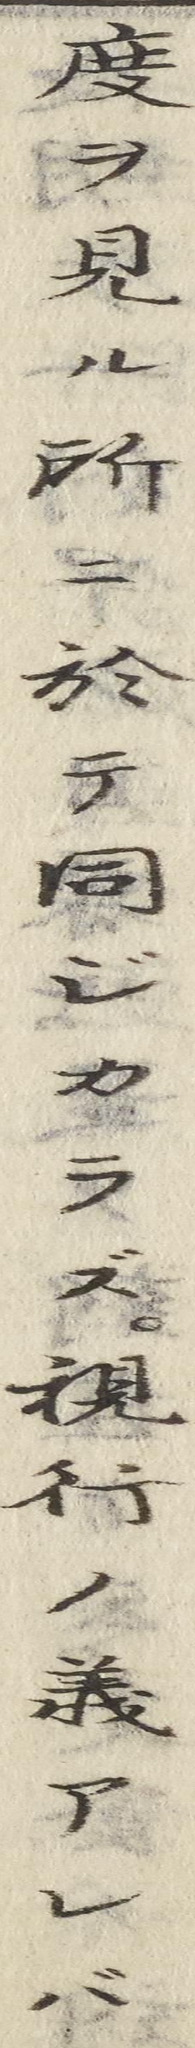度ヲ見ル所ニ於テ同ジカラズ。視行ノ義アレバ
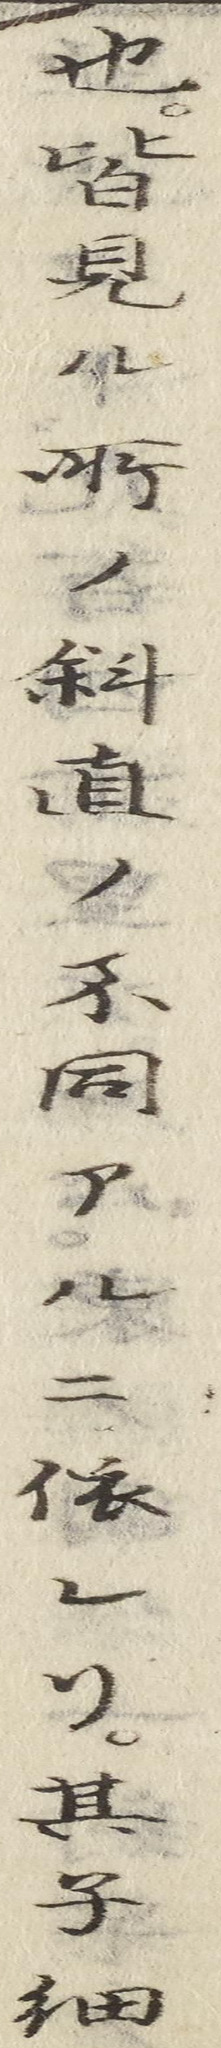也。皆見ル所ノ斜直ノ不同アルニ依レリ。其子細
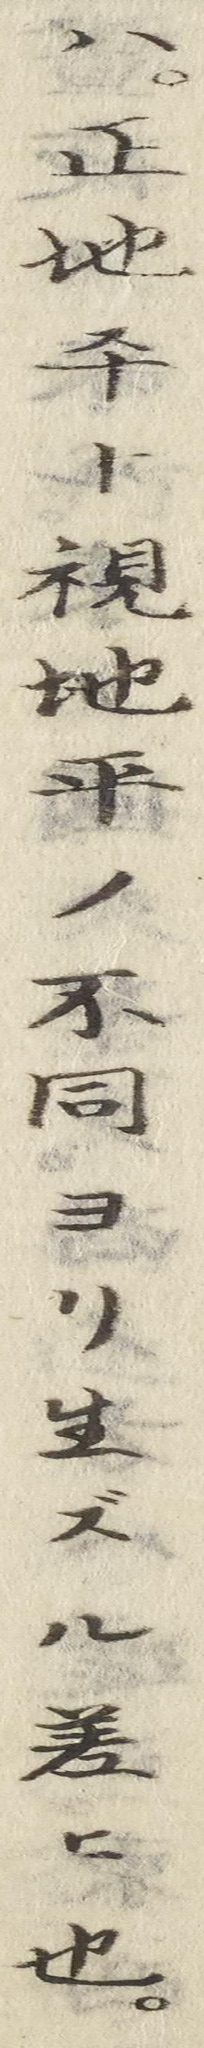ハ。正地平ト視地平ノ不同ヨリ生ズル差ヒ也。
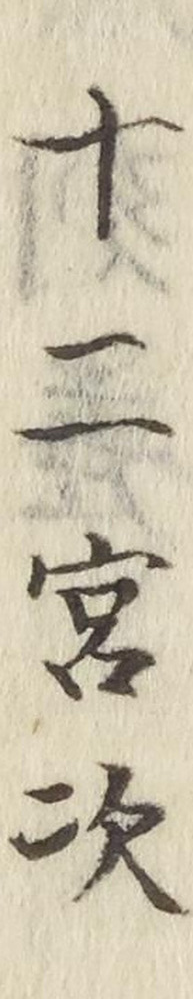十二宮次
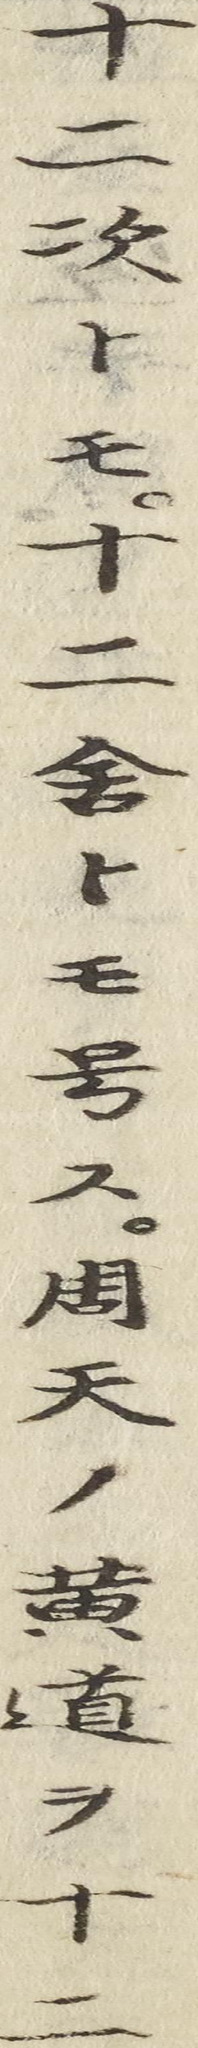十二次トモ。十二舎トモ号ス。周天ノ黄道ヲ十二
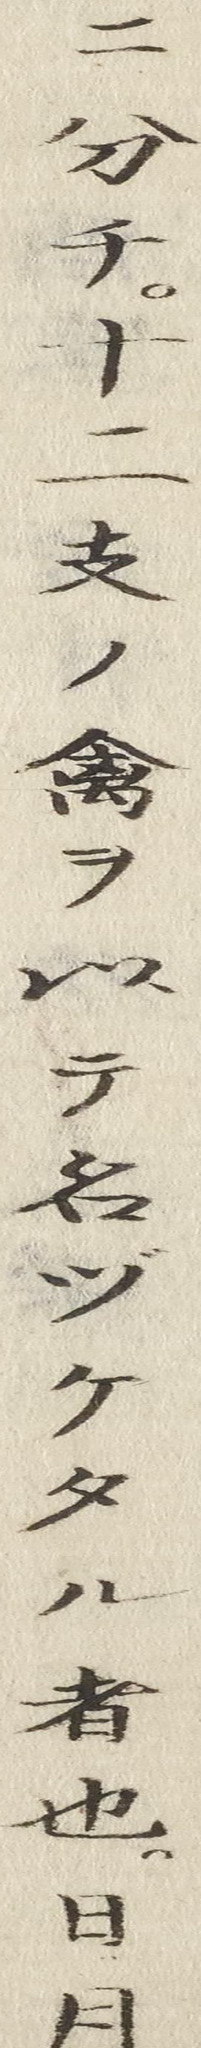ニ分テ。十二支ノ禽ヲ以テ名ヅケタル者也。日月
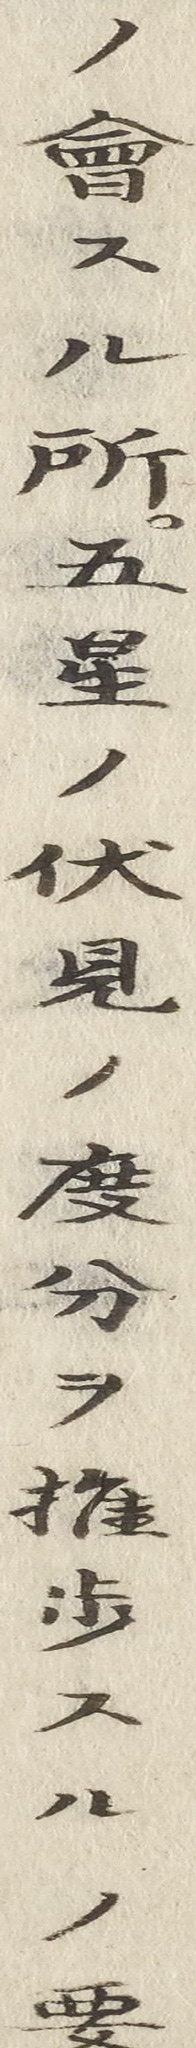ノ会スル所。五星ノ伏見ノ度分ヲ推歩スルノ要
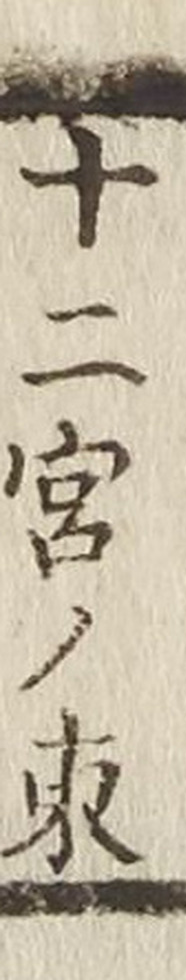十二宮ノ東
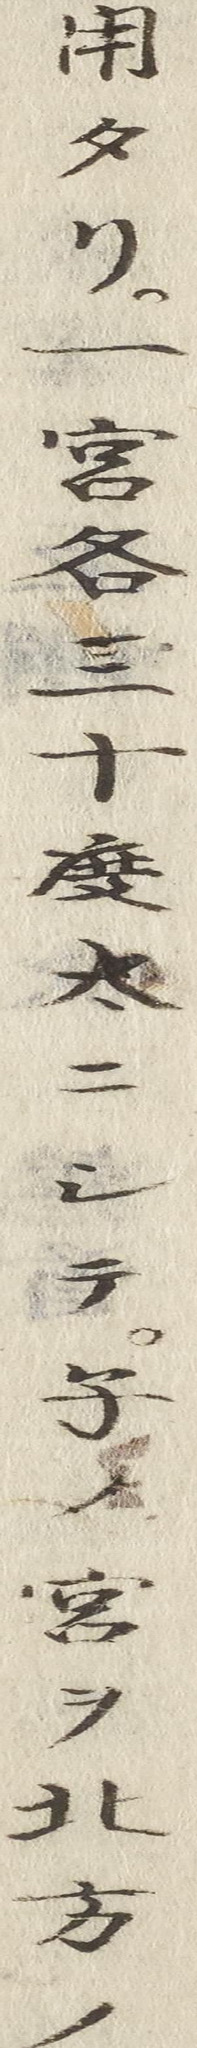用タリ。一宮各三十度太ニシテ。子ノ宮ヲ北方ノ
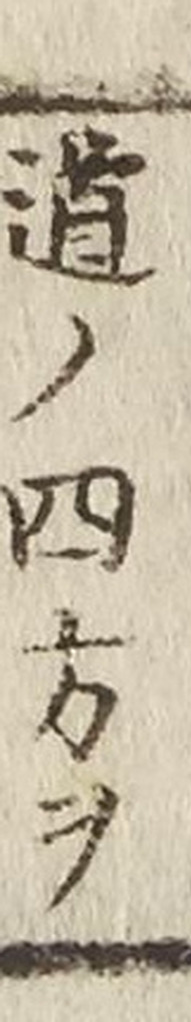道ノ四方ヲ
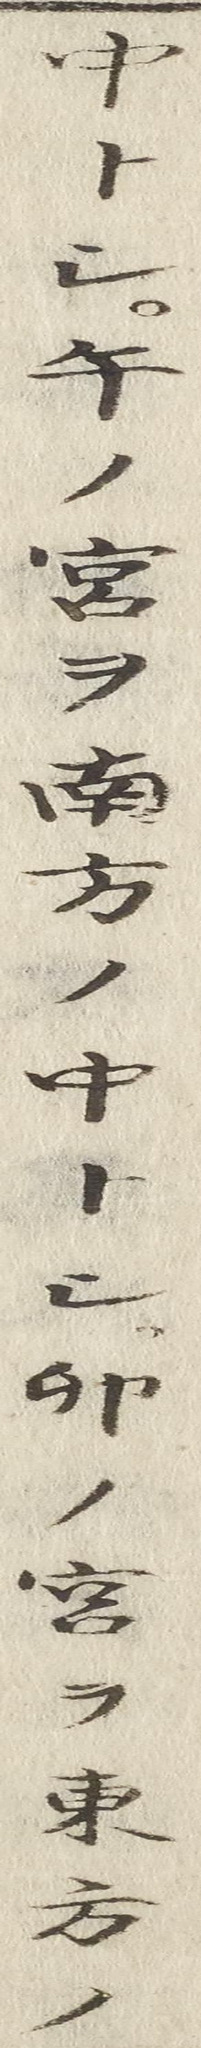中トシ。午ノ宮ヲ南方ノ中トシ。卯ノ宮ヲ東方ノ
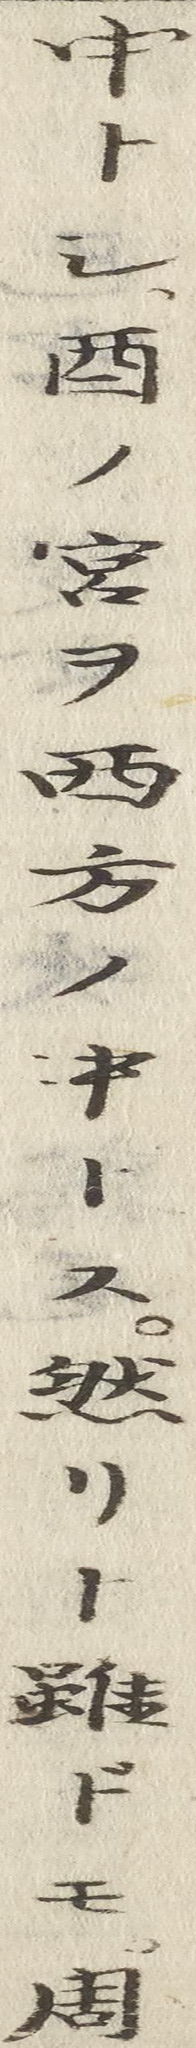中トシ。酉ノ宮ヲ西方ノ中トス。然リト雖ドモ周
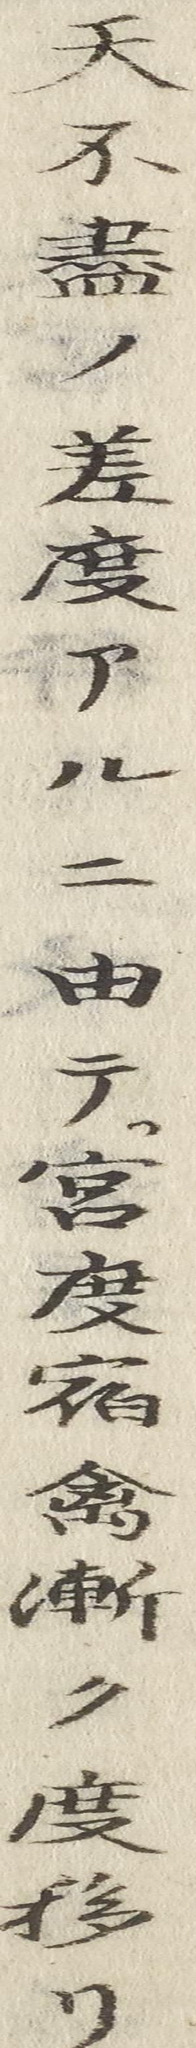天不尽ノ差度アルニ由テ。宮度宿禽漸ク度移リ
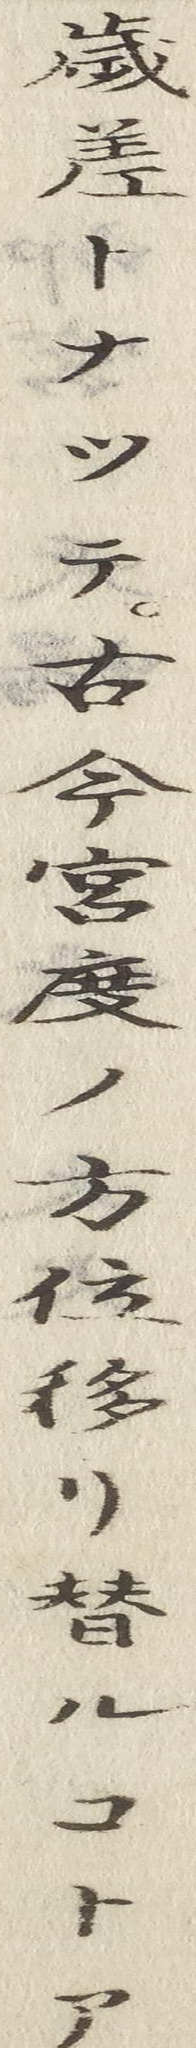歳差トナツテ。古今宮度ノ方位移リ替ルコトア
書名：大略天学名目鈔　天經或問附録
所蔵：東京大学地震研究所図書室 Earthquake Research Institute Library, The University of Tokyo, JAPAN
